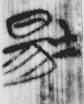塲
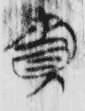賈
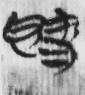既
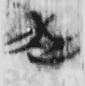走
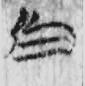於
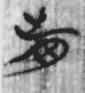前
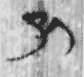孑
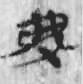弗
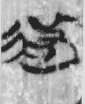﨤（及）
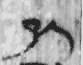孑
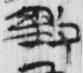執
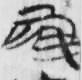雇
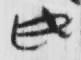女
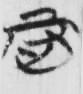○（返）
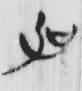加
